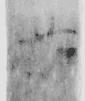{廿一}
